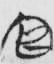官
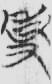事
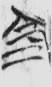命
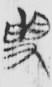受
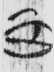正
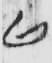㠯（以）
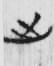出
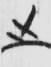之
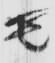𠁩
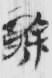○（舒）
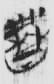○（許）
